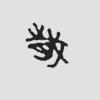歲
